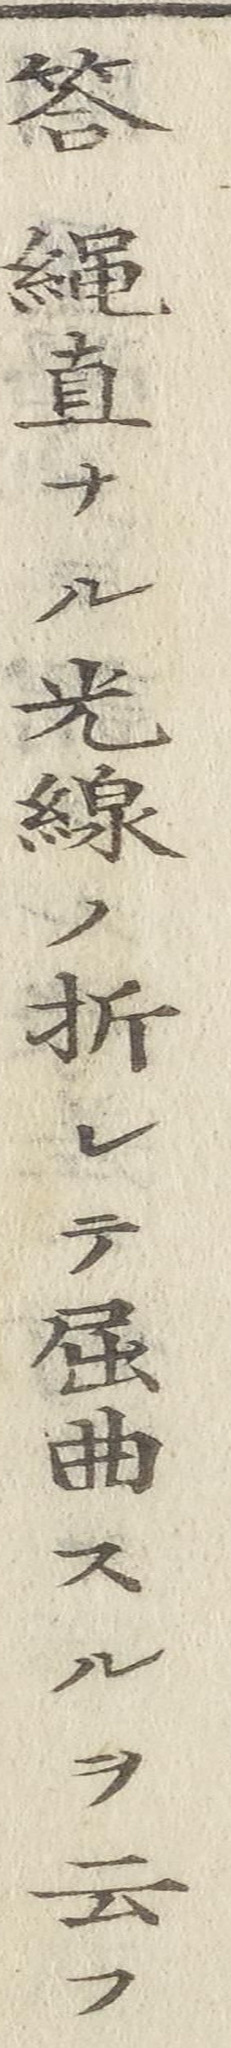答縄直ナル光線ノ折レテ屈曲スルヲ云フ

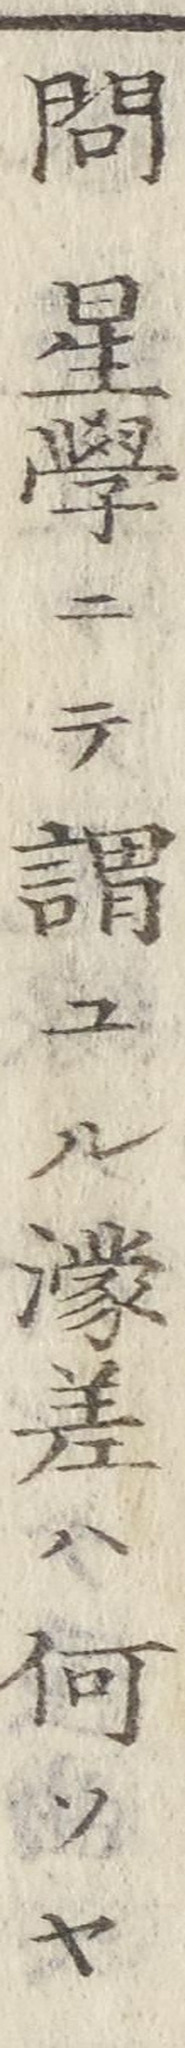問星学ニテ謂ユル濛差ハ何ソヤ
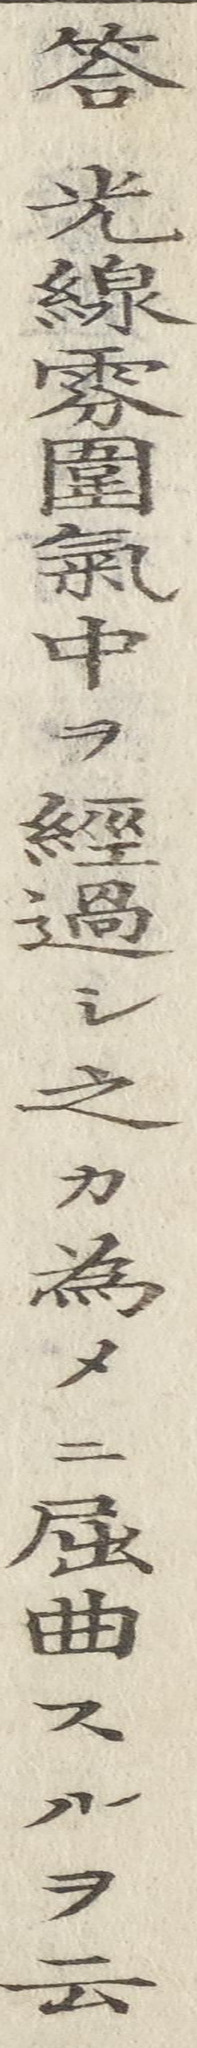答光線雰囲気中ヲ経過シ之カ為メニ屈曲スルヲ云
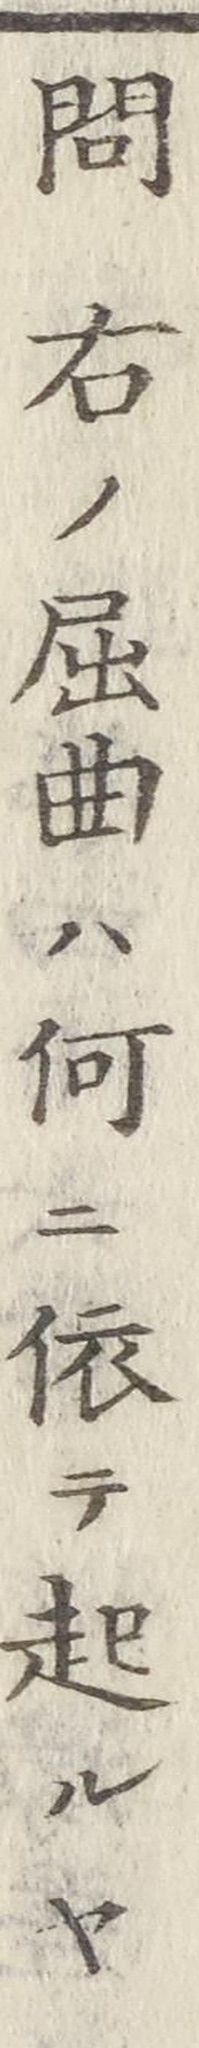問右ノ屈曲ハ何ニ依テ起ルヤ
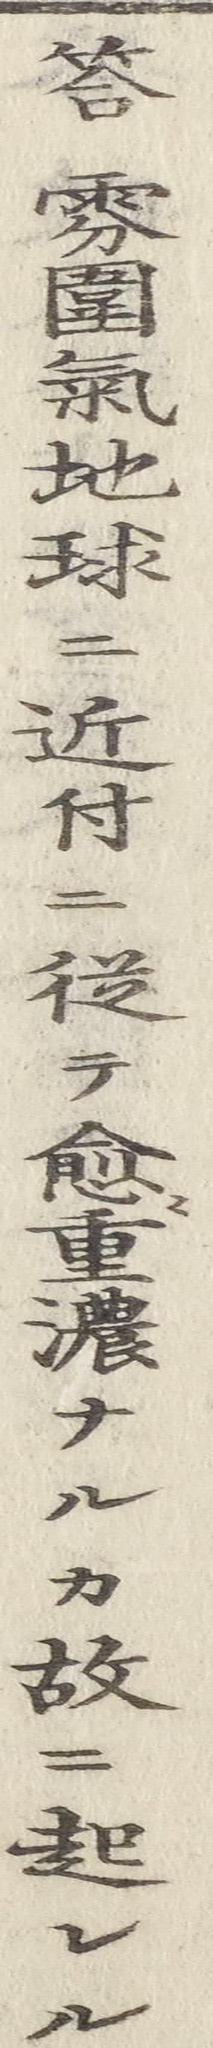答雰囲気地球ニ近付ニ従テ愈〱重濃ナルカ故ニ起レル
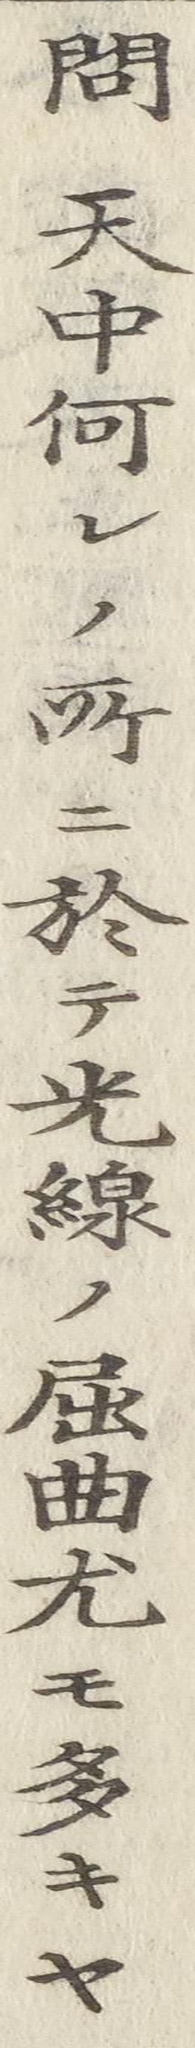問天中何レノ所ニ於テ光線ノ屈曲尤モ多キヤ
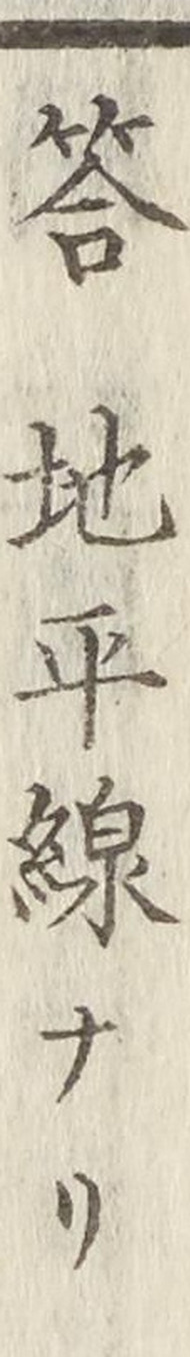答地平線ナリ
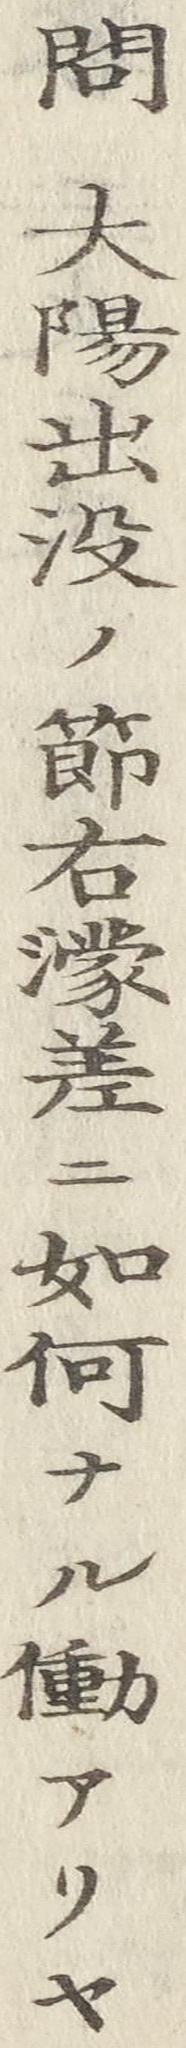問大陽出没ノ節右濛差ニ如何ナル働アリヤ
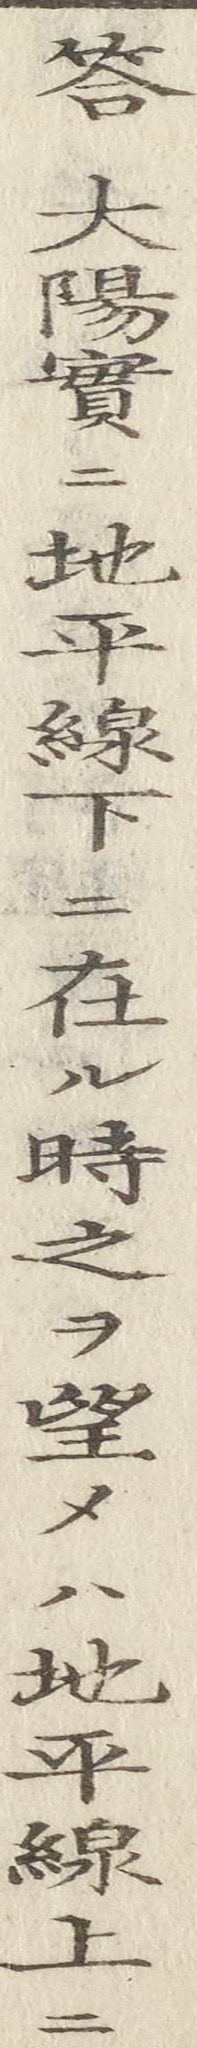答大陽実ニ地平線下ニ在ル時之ヲ望メハ地平線上ニ
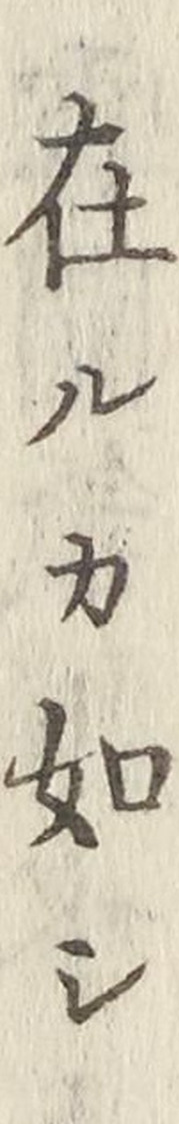在ルカ如シ
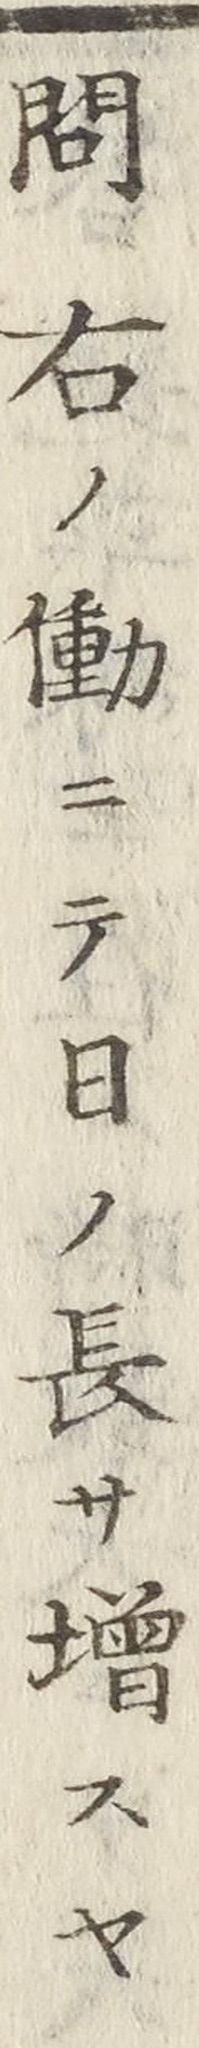問右ノ働ニテ日ノ長サ増スヤ
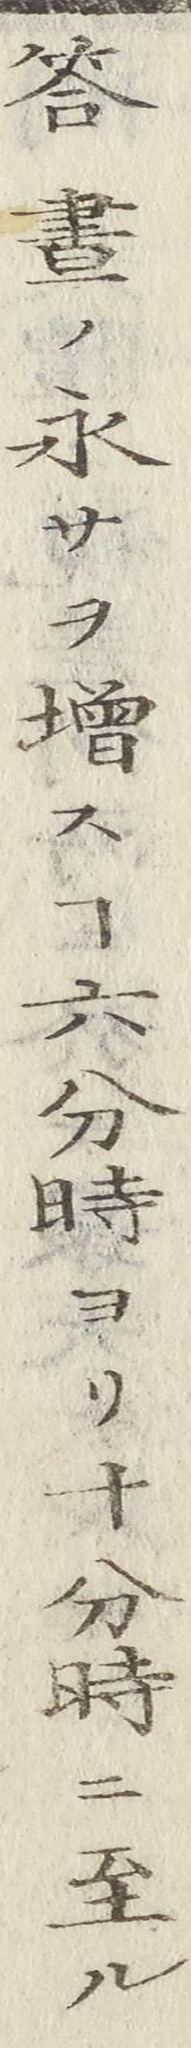答昼ノ永サヲ増スコト六分時ヨリ十分時ニ至ル
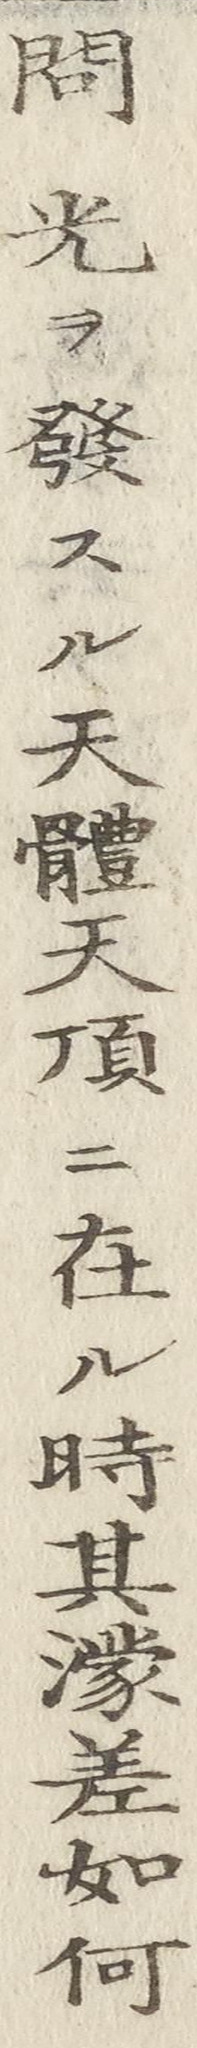問光ヲ発スル天体天頂ニ在ル時其濛差如何
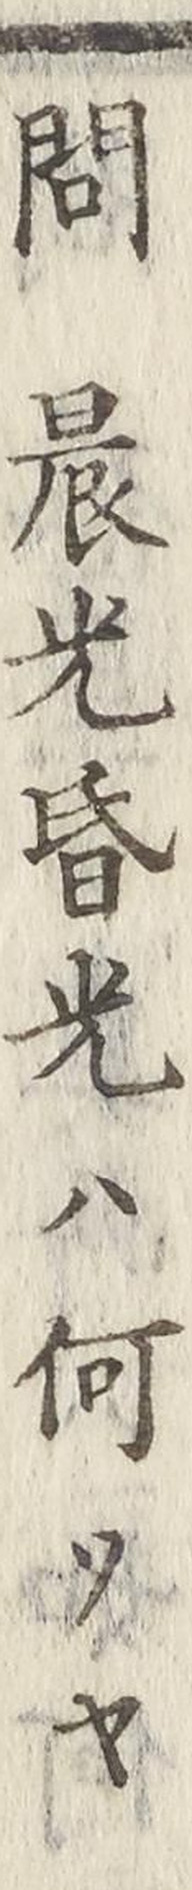問晨光昏光ハ何ソヤ
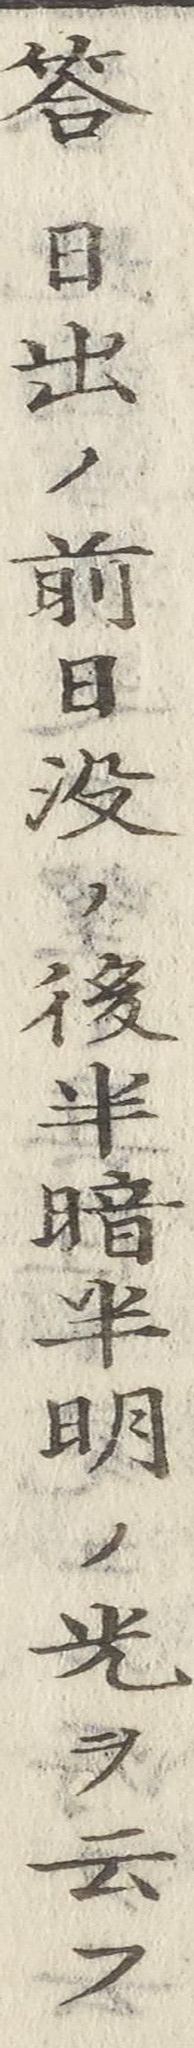答日出ノ前日没ノ後半暗半明ノ光ヲ云
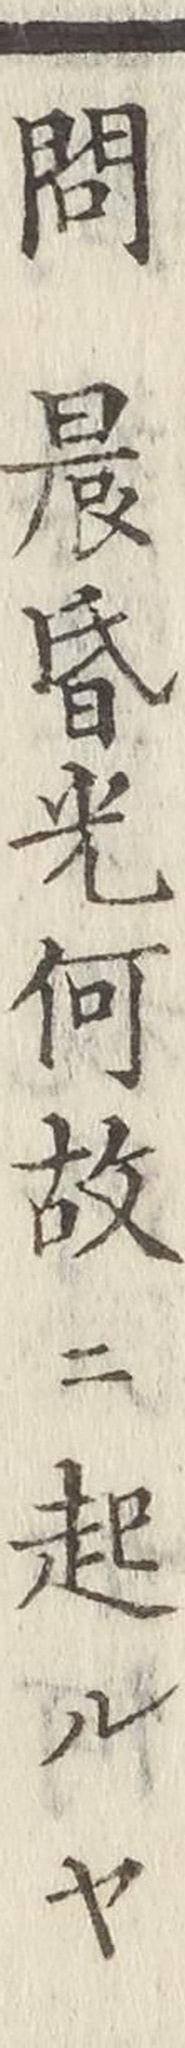問晨昏光何故ニ起ルヤ
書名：星学圖説　下
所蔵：東京大学地震研究所図書室 Earthquake Research Institute Library, The University of Tokyo, JAPAN
